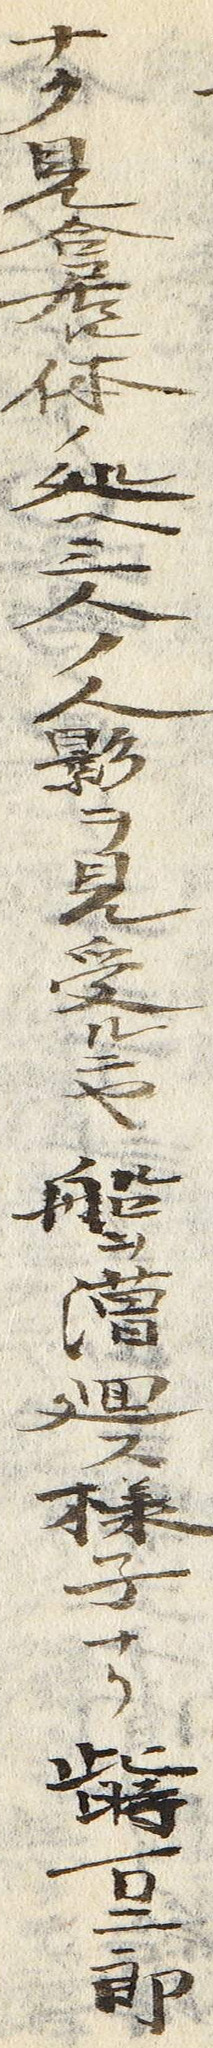ナク見合居ル体ノ処ヘ三人ノ人影ヲ見受ルニヤ船ヲ漕廻ス様子ナリ此時万二郎
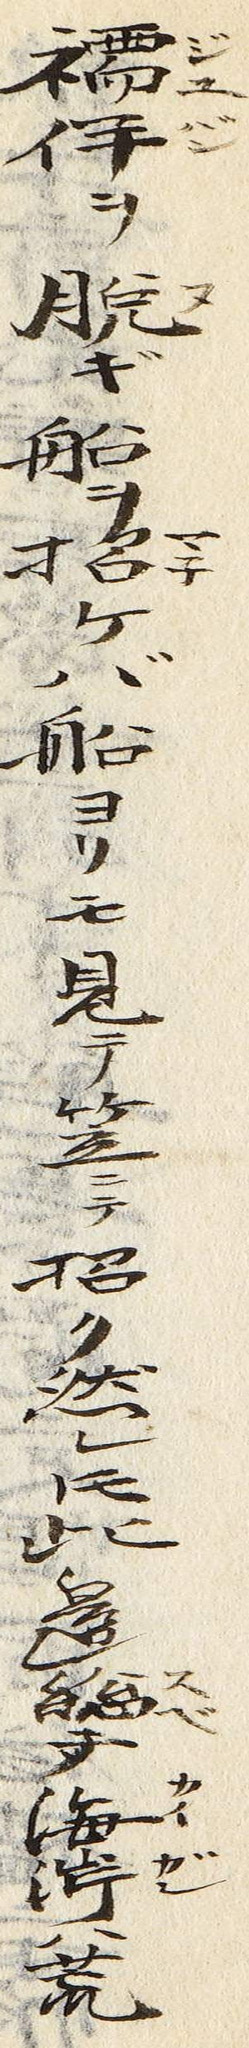襦袢ヲ脱ギ船ヲ招ケバ船ヨリモ見テ笠ニテ招ク然レトモ此島総テ海岸ハ荒
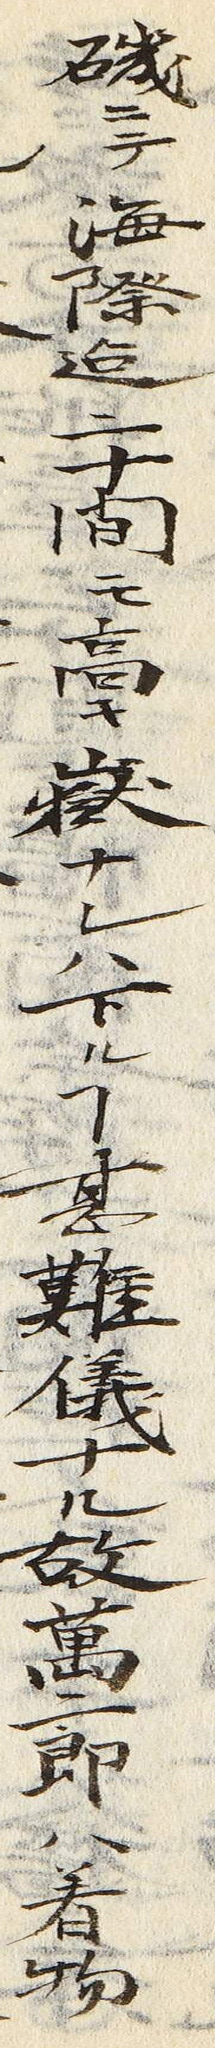磯ニテ海際迄二十間モ高キ嶽ナレハ下ルコト甚難儀ナル故萬二郎ハ着物
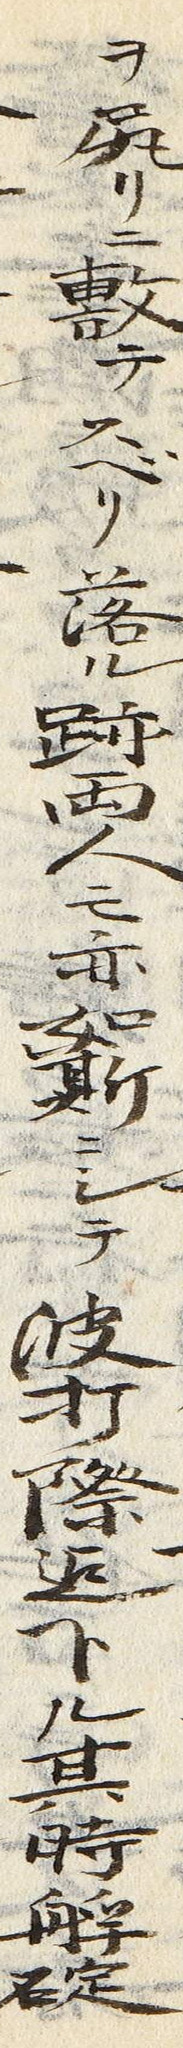ヲ尻リニ敷テスベリ落ル跡両人モ亦如斯ニシテ波打際迄下ル其時艀碇
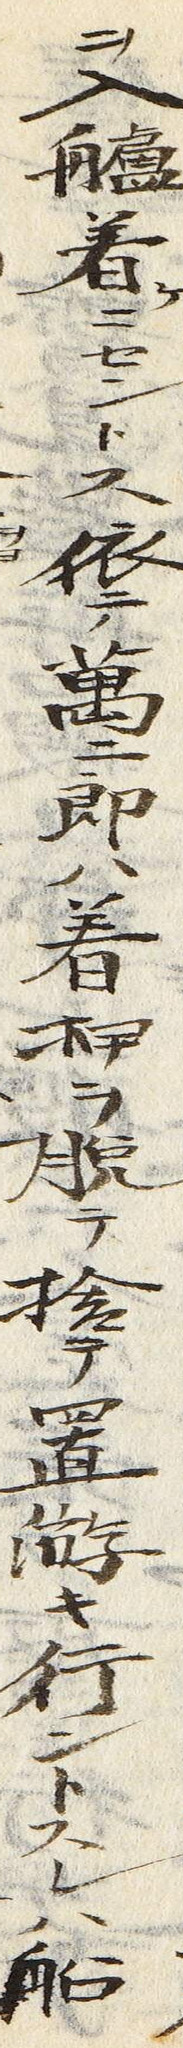ヲ入艫着ケニセントス依テ萬二郎ハ着押ヲ脱テ置游キ行ントスレハ船
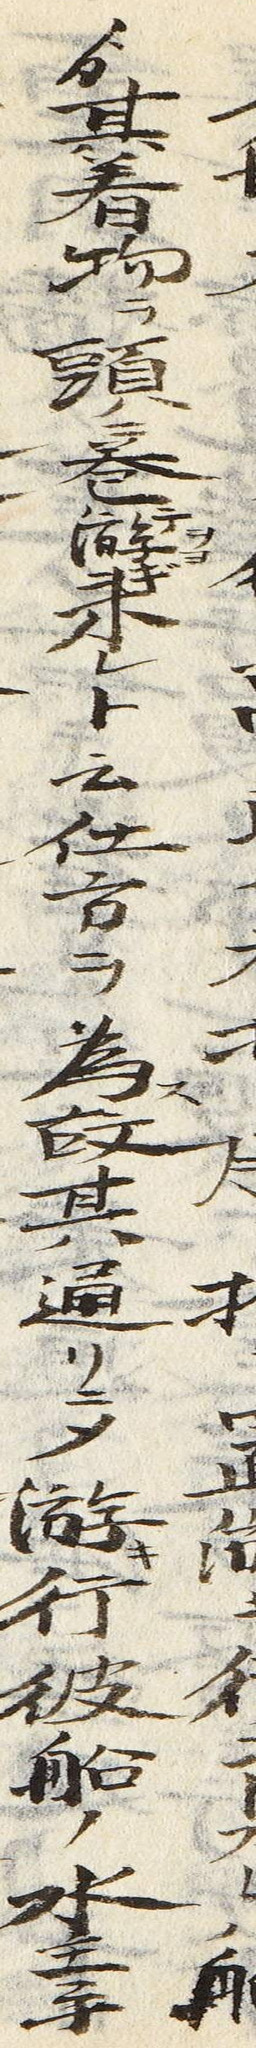ゟ其着物ヲ頭テ巻テ游ギ来レト云仕方ヲ為ス故其通リニ〆游キ行彼船ノ水主手
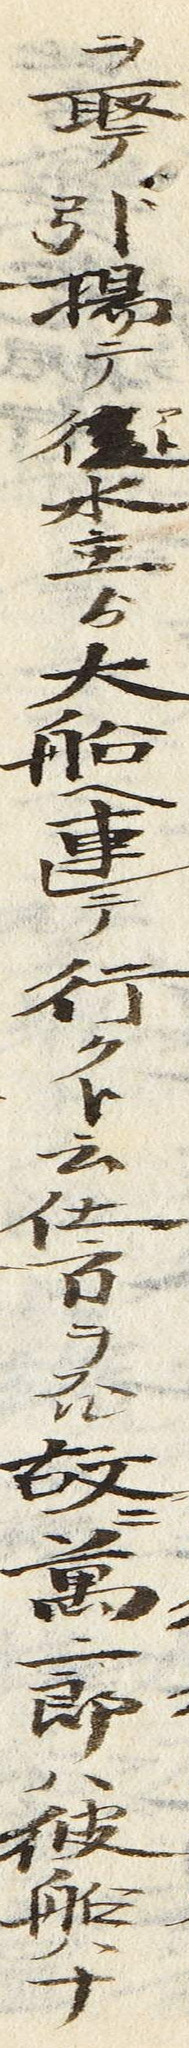ヲ取テ引揚テ後水主ゟ大船ヘ連テ行クト云仕方ヲスル故ニ萬二郎ハ彼船ハナ
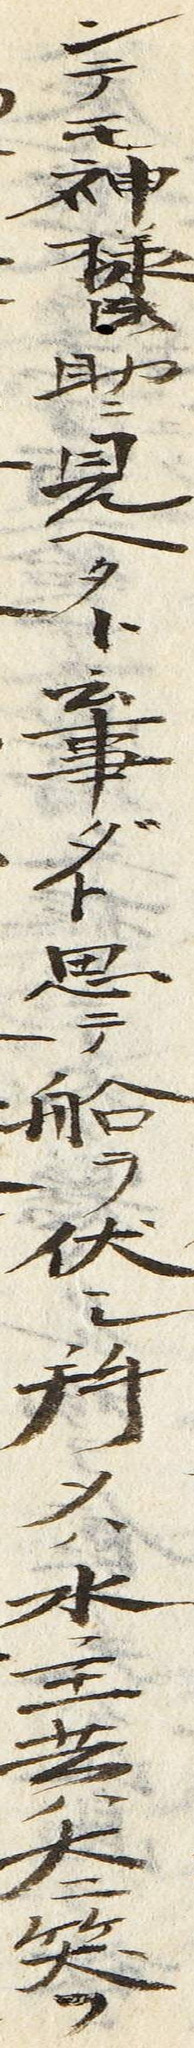ンテモ神様御助ニ見へタト云事ダト思テ船ヲ伏シ拝メハ水主共ハ大ニ笑フ
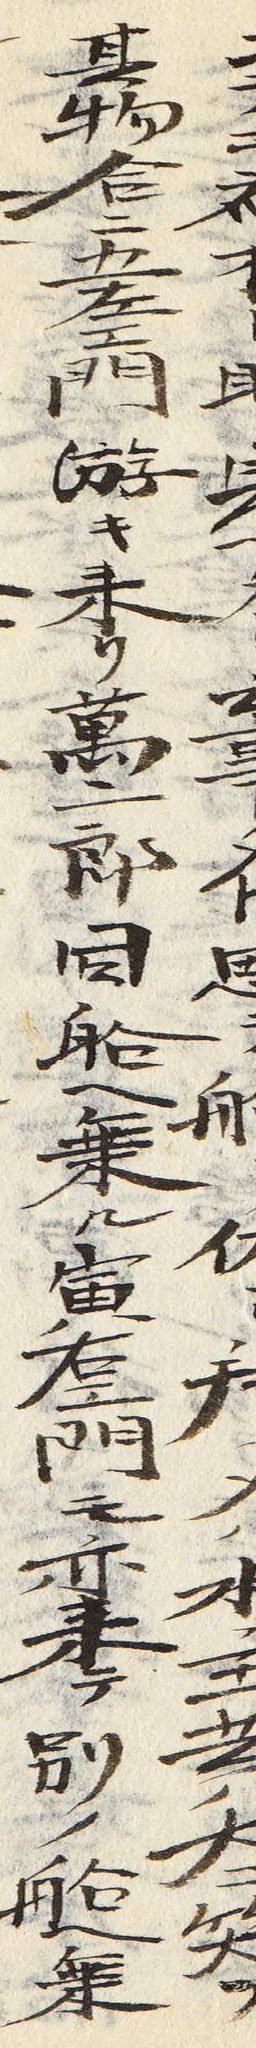其物合ニ五左衛門游キ来リ萬二郎同船ヘ乗ル寅右衛門モ亦来テ別ノ船ヘ乗
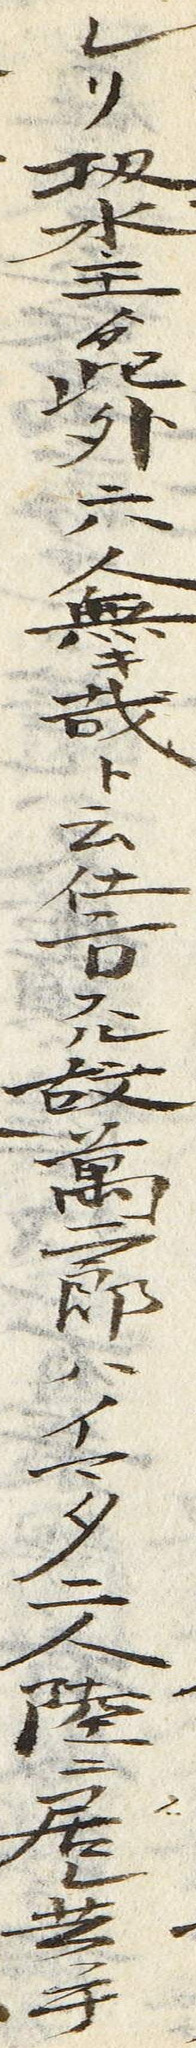レリ扨水主ゟ此外六人無キ哉ト云仕方スル故萬二郎ハイマタ二人陸ニ居レ共手
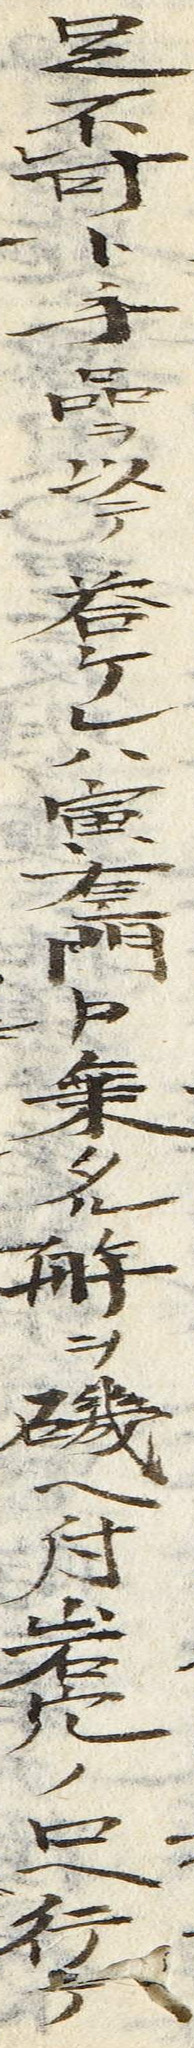足不可ト手品ヲ以テ答ケレハ寅右衛門申乗タル船ヲ磯ヘ付岩穴ノ口ヘ行テ
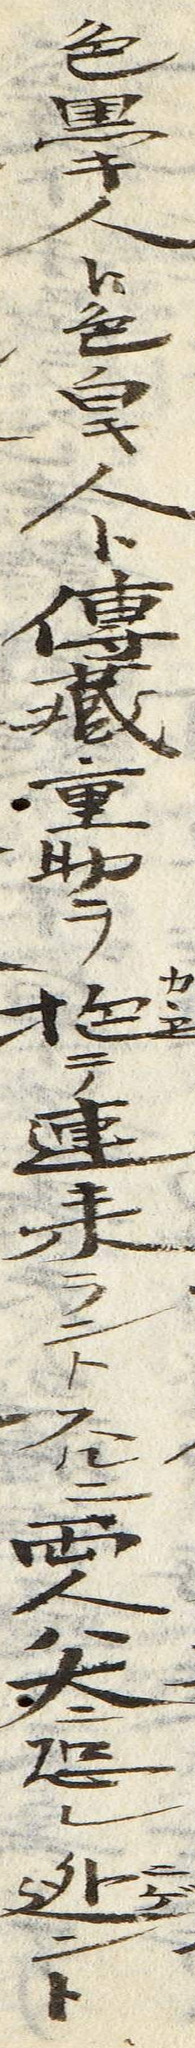色黒キ人ト色白キ人ト傳蔵重助ヲ抱テ連来ラントスルニ両人ハ大ニ恐レ迯ント
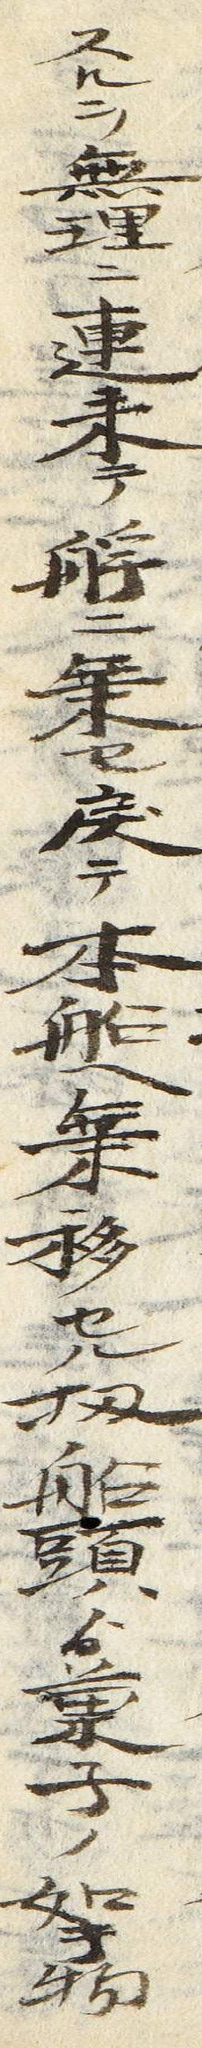スルヲ無理ニ連来テ船ニ乗セ戻テ本船ヘ乗移セル扨船頭ゟ菓子ノ如キ物

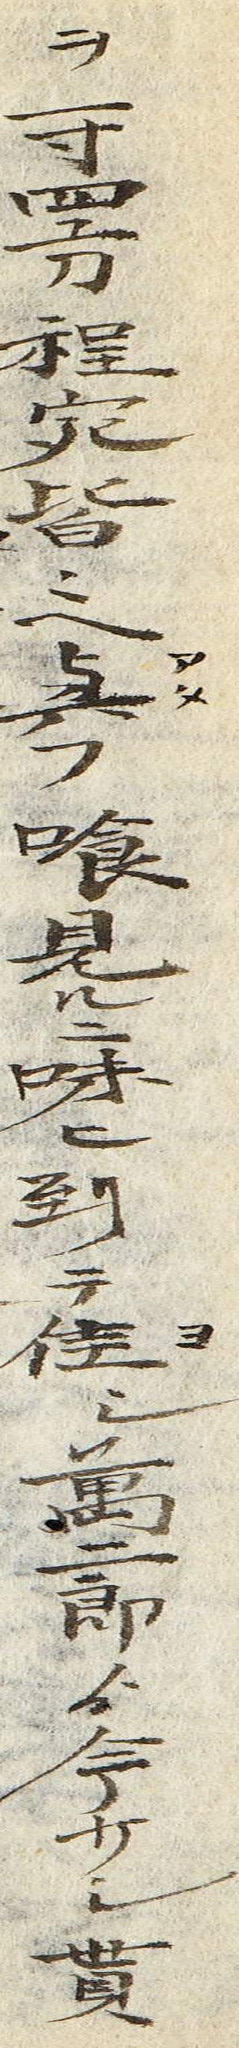ヲ一寸四方程宛皆々ヘ与フ喰見ルニ味ヒ到テ佳シ萬二郎ゟ今少シ貰
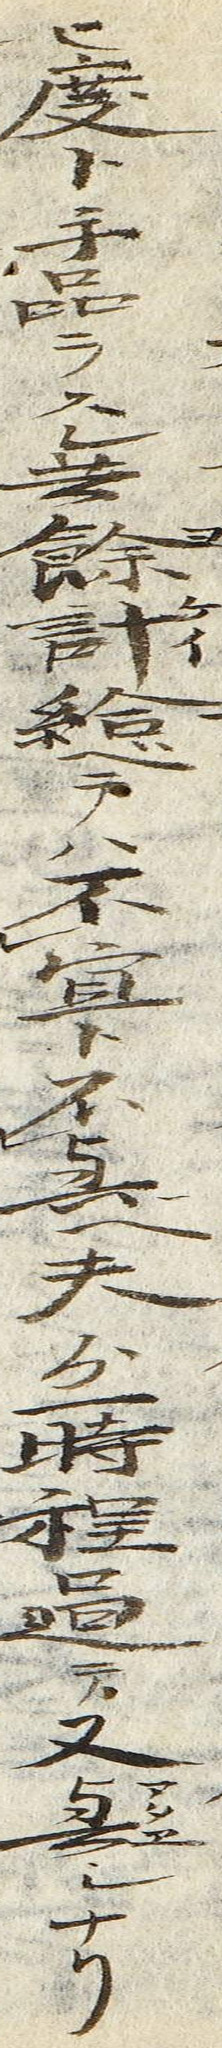ヒ度ト手品ヲスレ共余計給ベテハ不宜ト不与ヘ夫ゟ一時程過テ又与シナリ
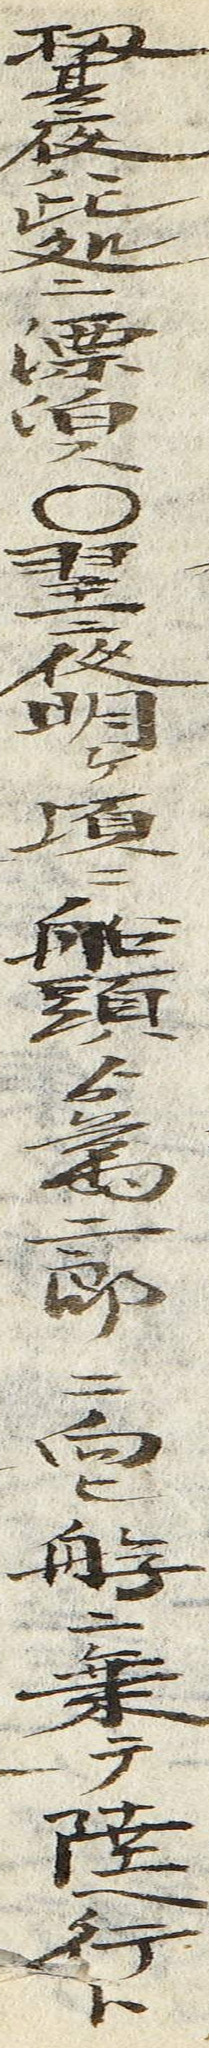扨其夜ハ此処ニ漂泊ス〇翌夜明ケ頃ニ船頭ゟ萬二郎ニ向ヒ艀ニ乗テ陸ヘ行ト
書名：漂流記聞
